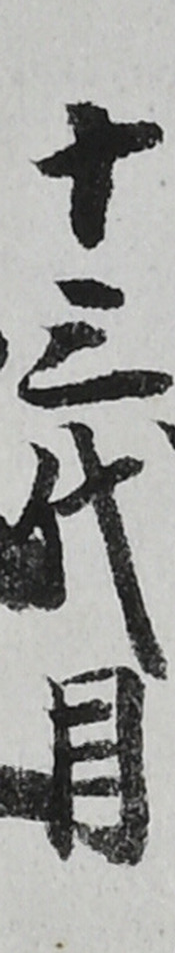十三代目
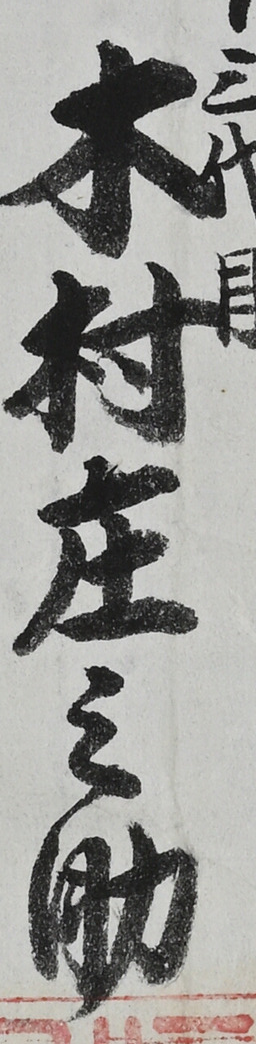木村庄之助
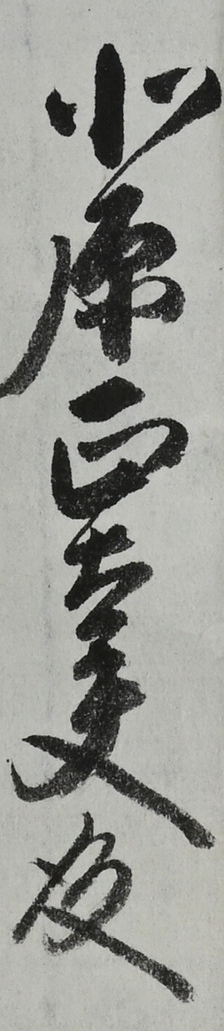北原正太夫殿
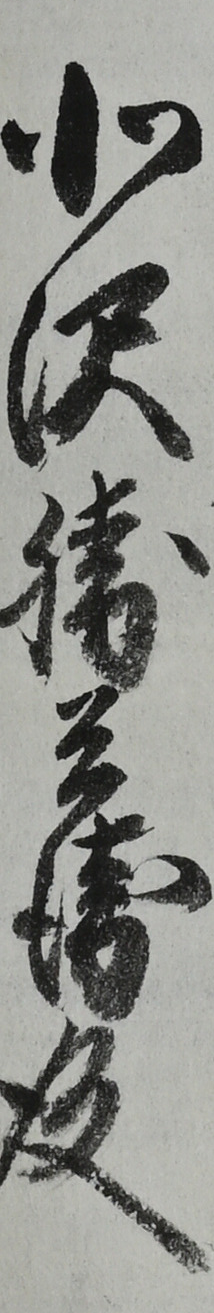北沢勝兵衛殿

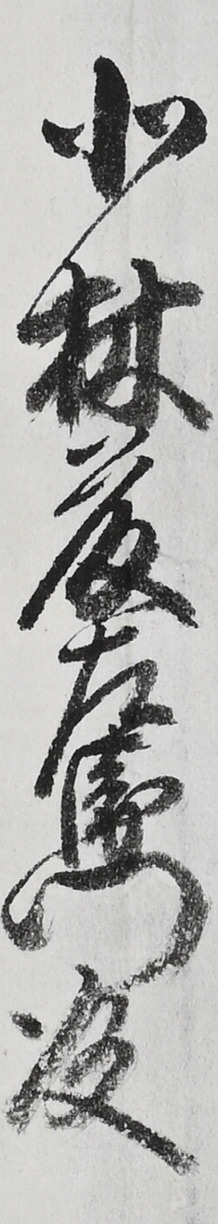北林籐左衛門殿
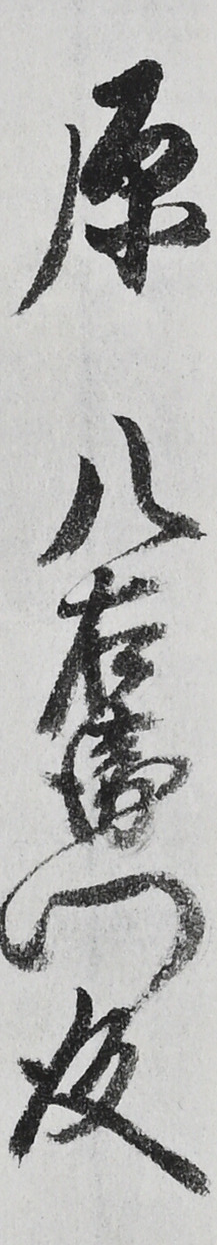原八右衛門殿
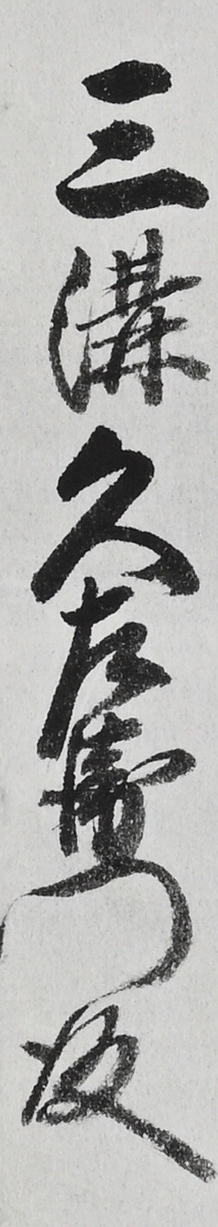三溝久左衛門殿
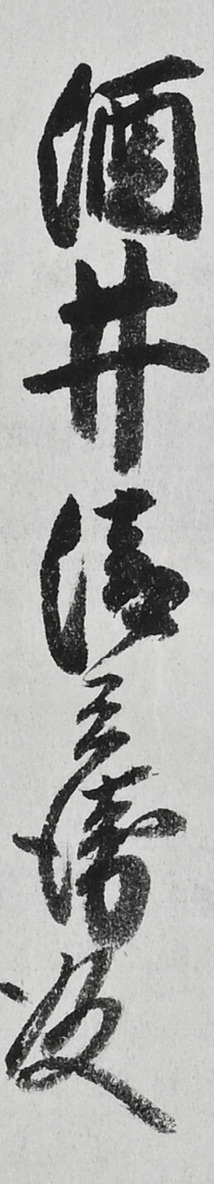酒井清兵衛殿
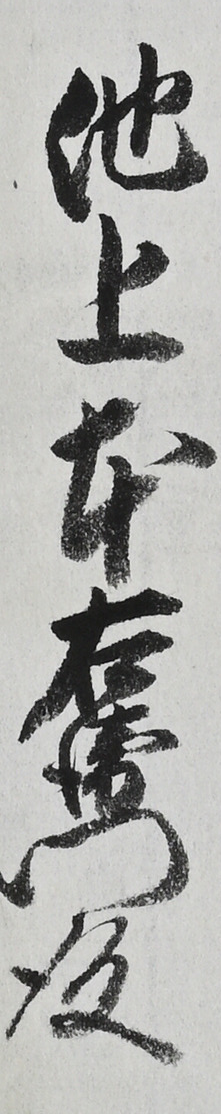池上本右衛門殿
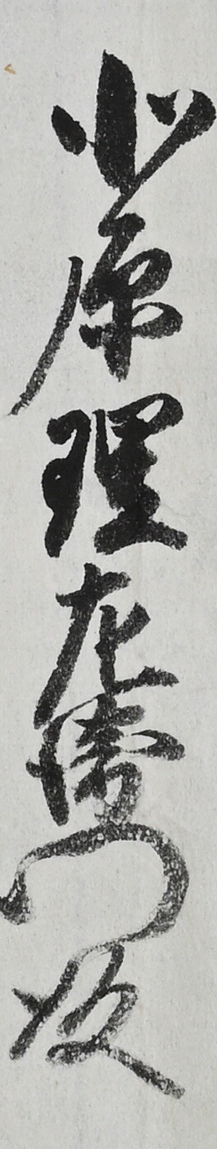北原理左衛門殿
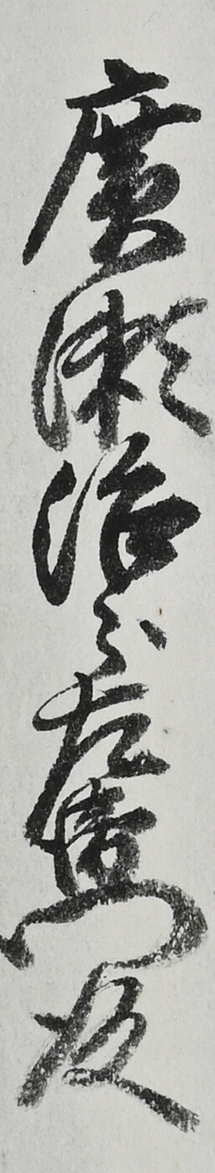廣瀬治郎左衛門殿
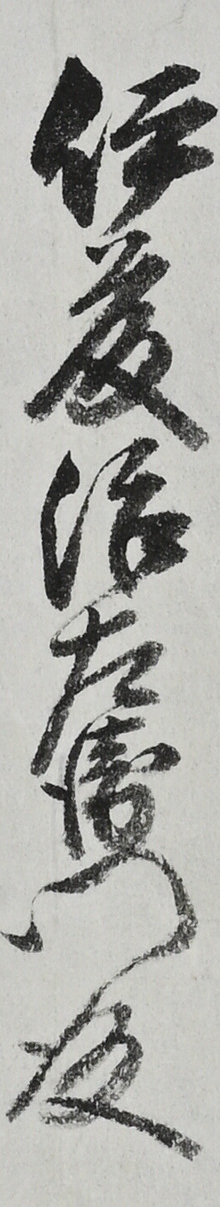伊藤治左衛門殿
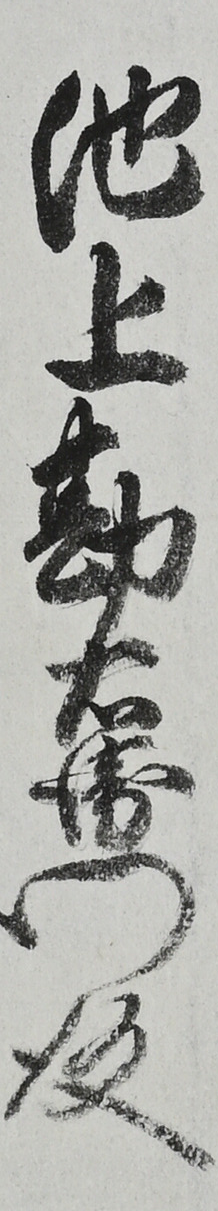池上勘右衛門殿
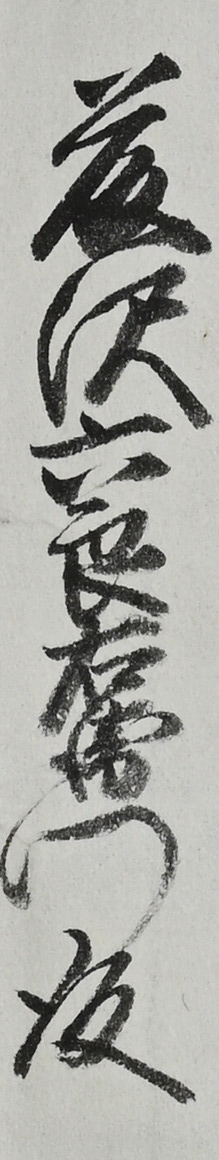藤沢六良右衛門殿
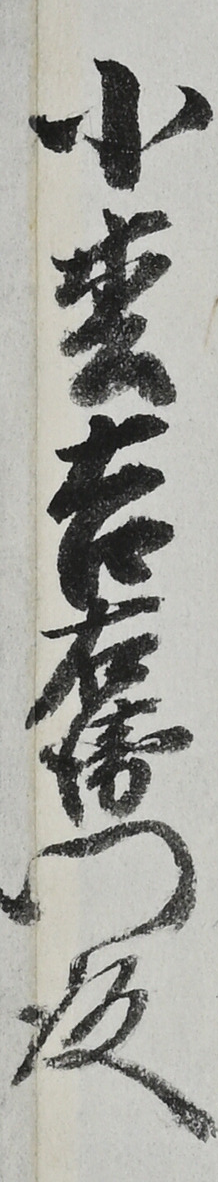小松吉右衛門殿
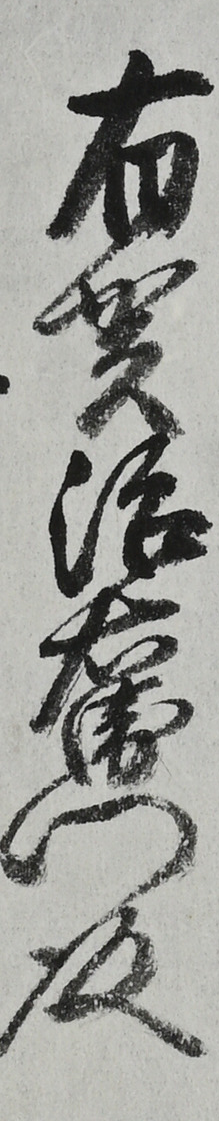有賀治右衛門殿
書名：祭礼相撲四本柱土俵幷櫓太鼓免許
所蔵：伊那市立高遠町図書館・合同会社AMANE
